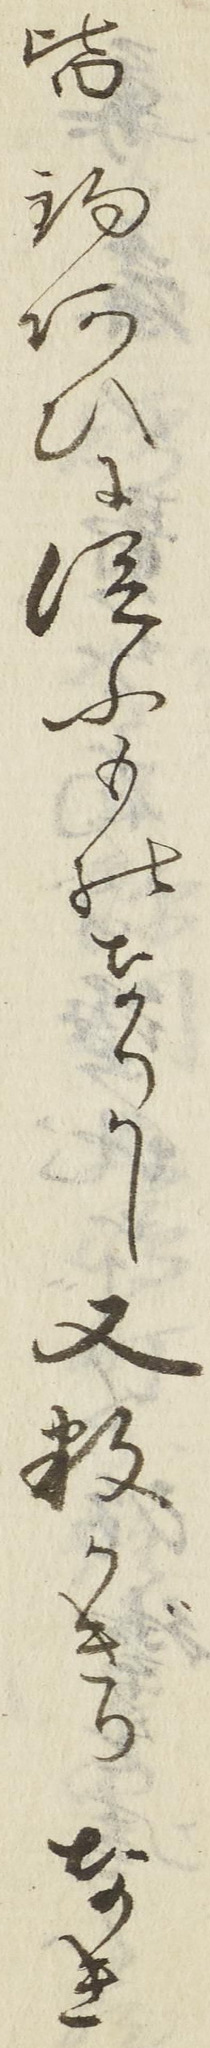皆釣あひに従ふものなりかし又数かぎりなき
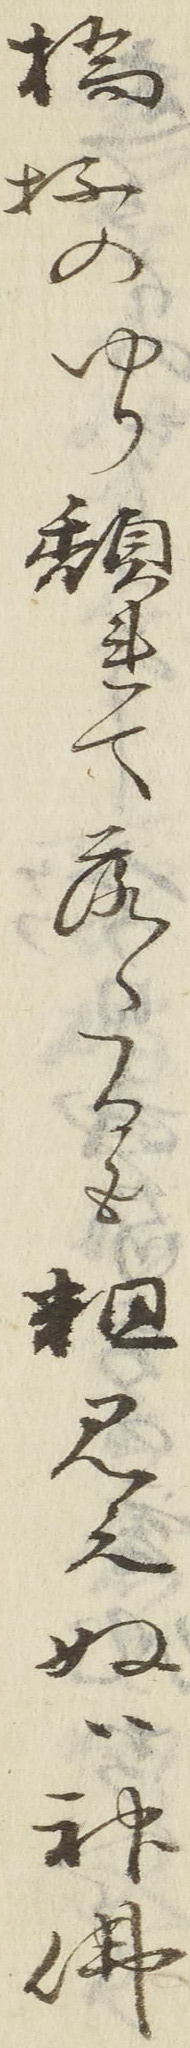橋抔のゆり頽れて落たるも粗見えぬは神仏
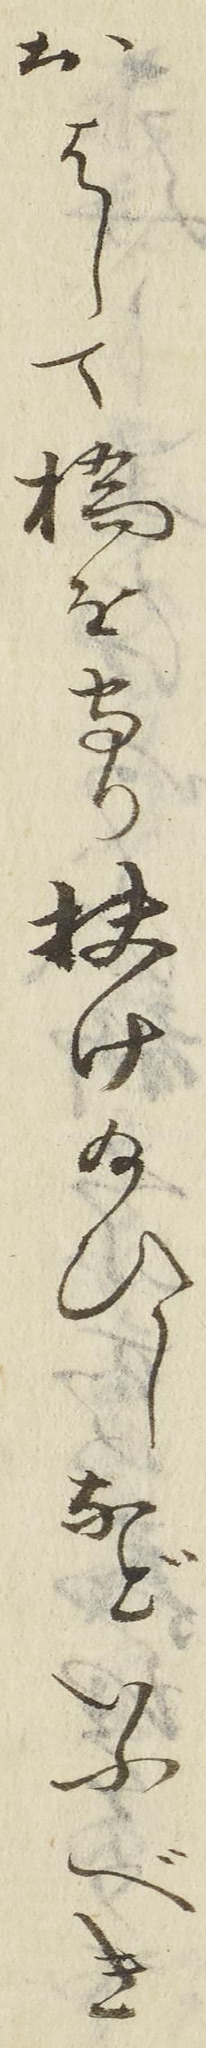おはして橋を守り扶け給ひしなどいふべき
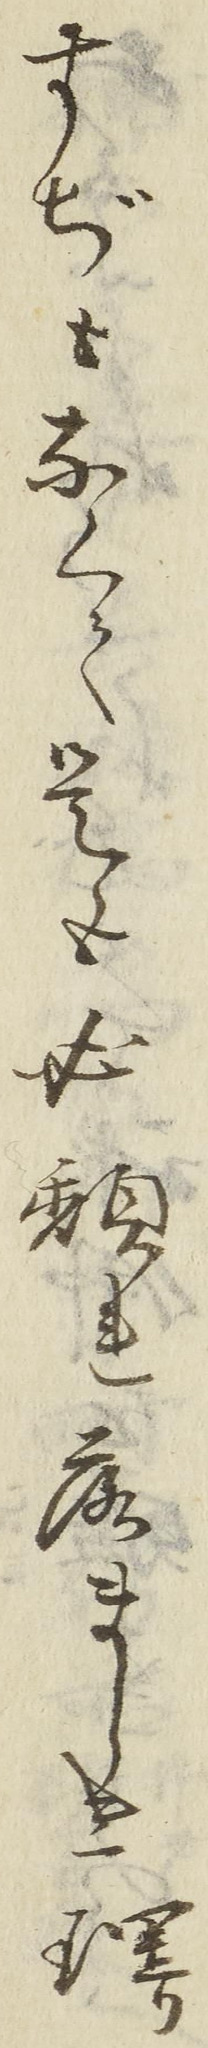すじもなくて是も必頽れ落ましき理

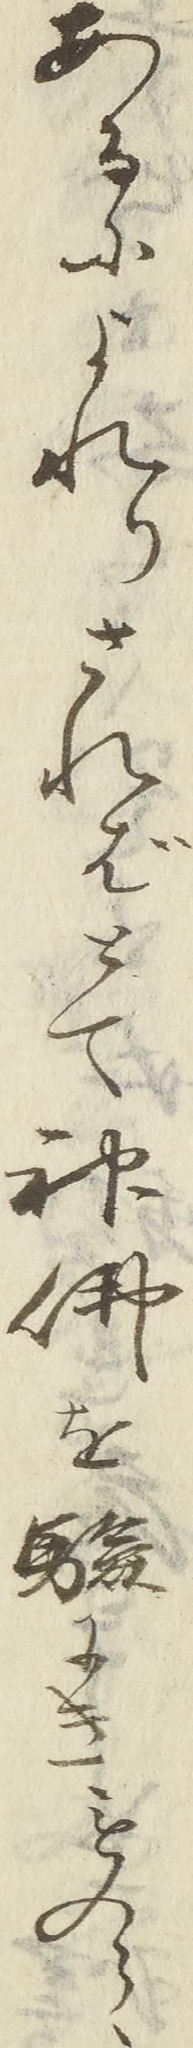あるによれりさればとて神仏を験にきものと
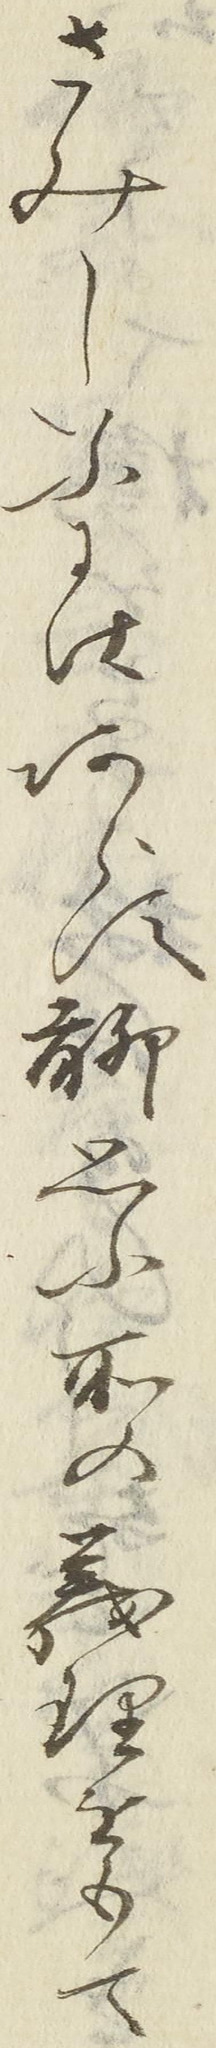さみしいふにはあらす聊思ふ所の義理をもて
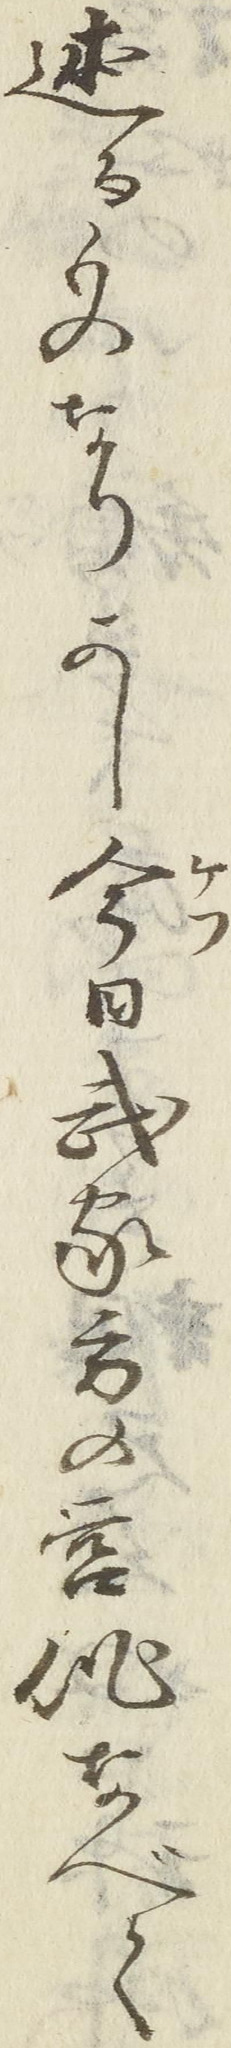述るものなりかし今日武家方の営作なべて
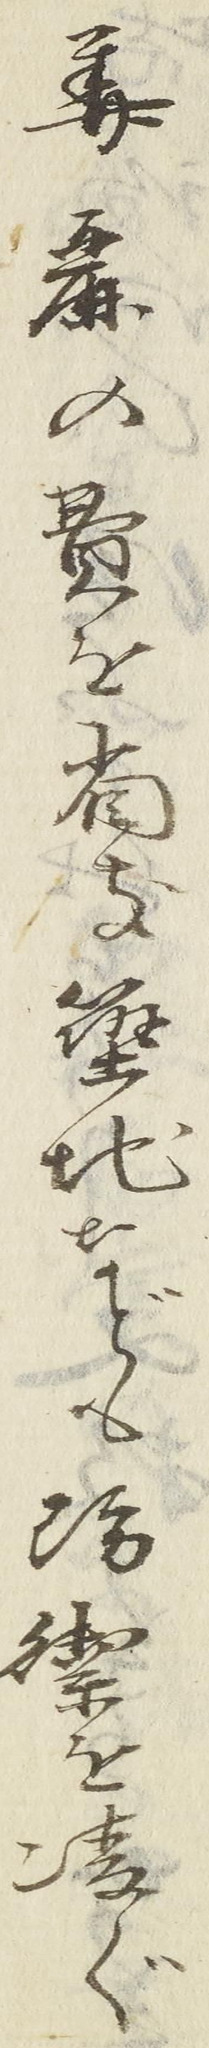美麗の費を省き築地なども防禦を凌ぐ
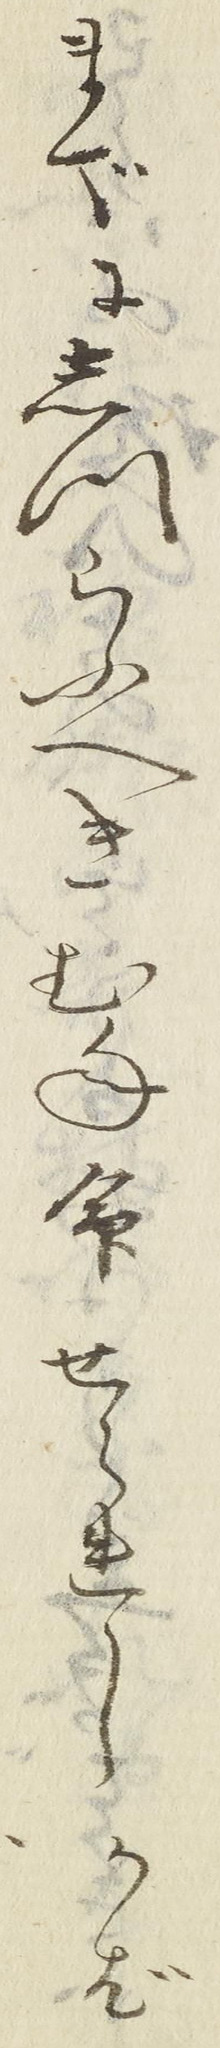までにしつらふへきむね命せられしかば
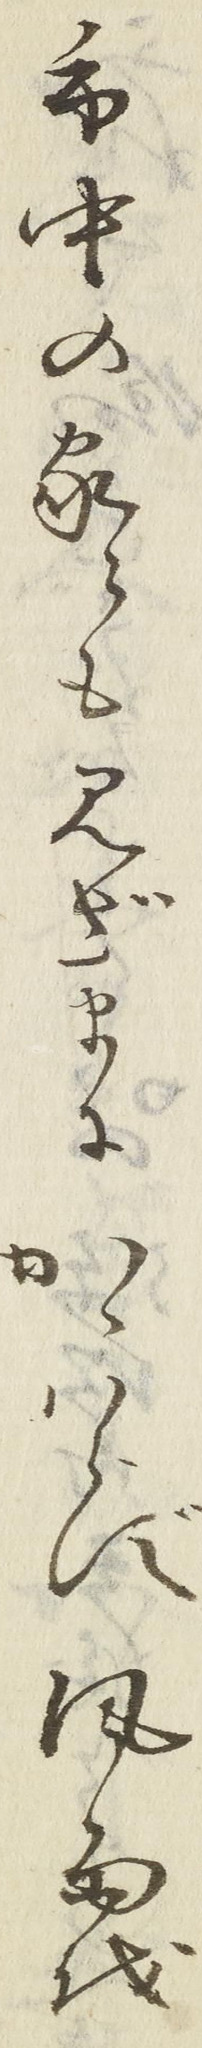市中の家〻も見ざまにかゝはらず風雨を
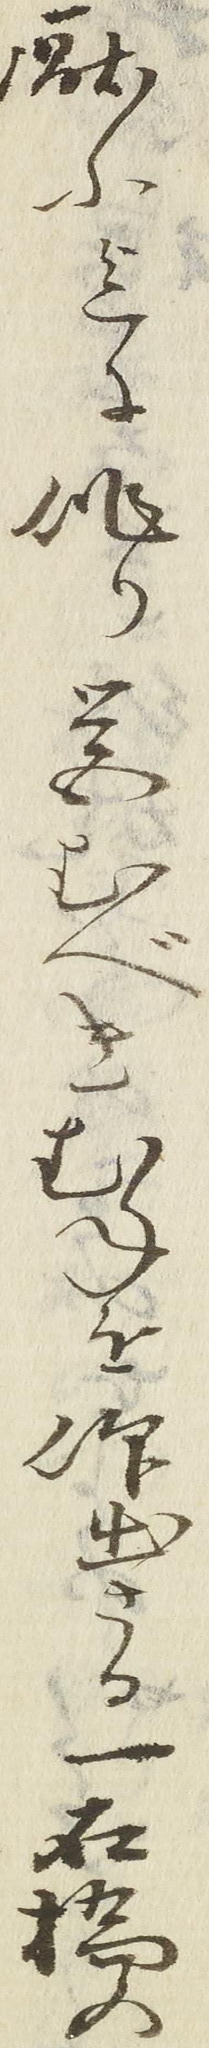厭ふ迄に作り営むべきむねを仰出さる一石橋の
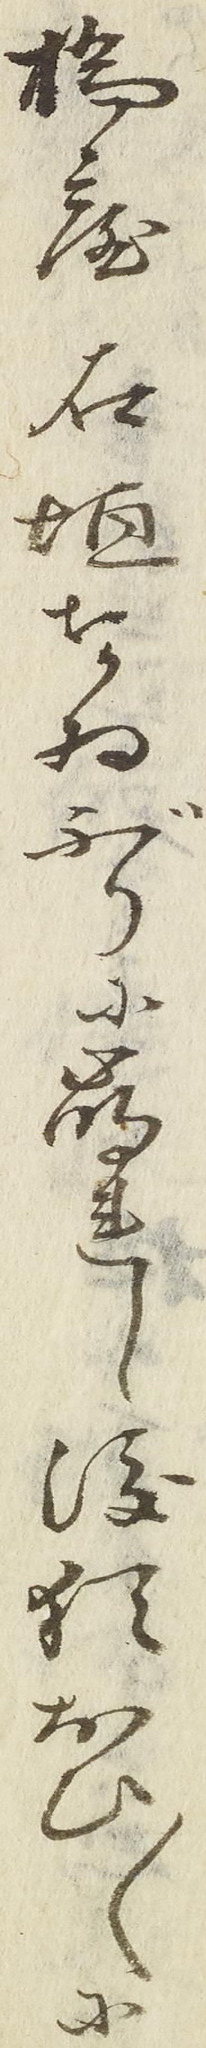橋台石垣なゐぶりに崩れし後猶おひ〳〵に
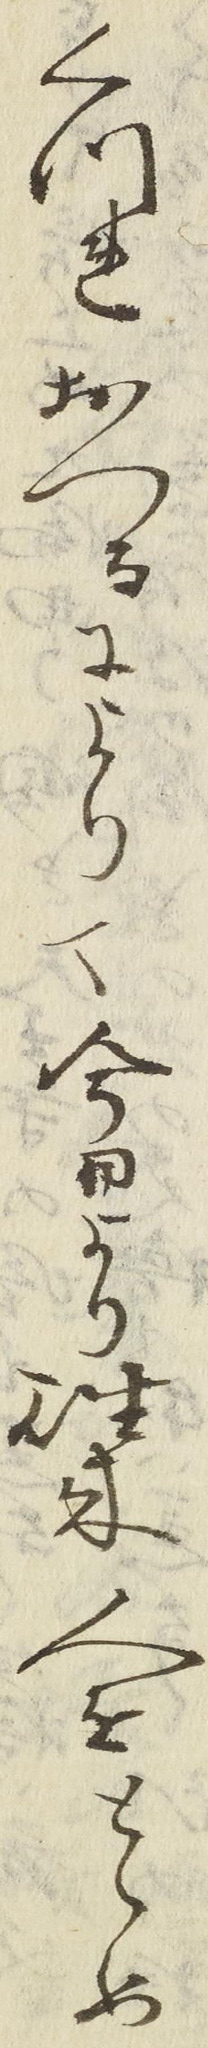くつれおつるによりて今日より往来人をとゝめ
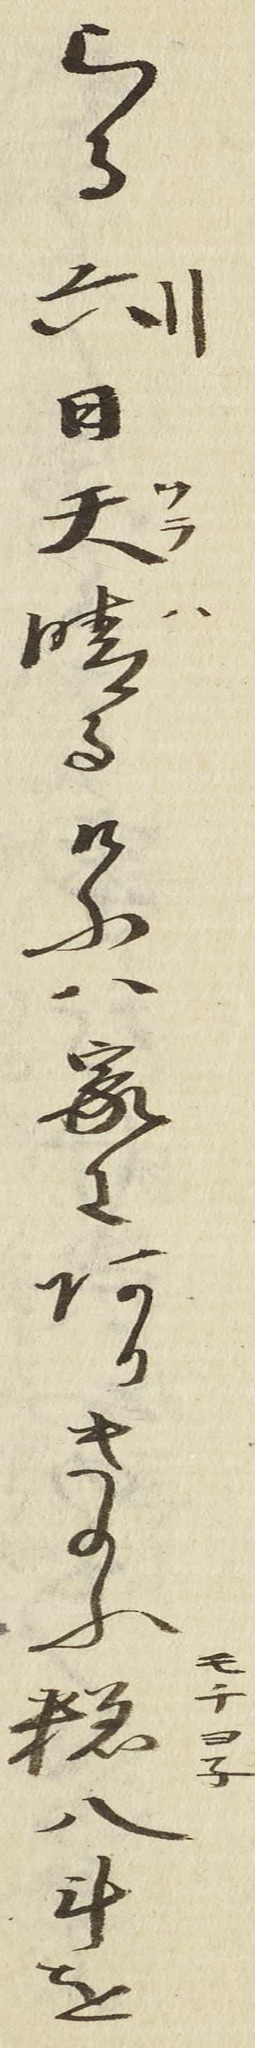らる六日天晴るけふは家にありきのふ糯八斗を
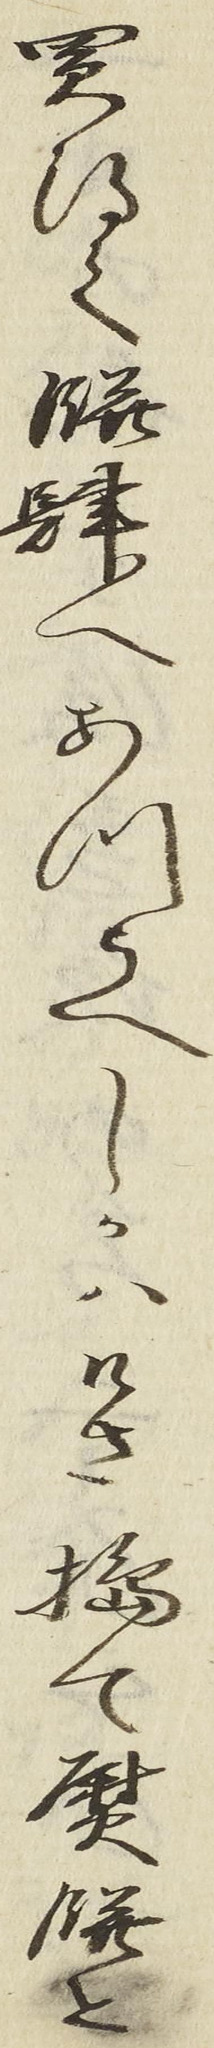買得て餅肆へあつらへしかはけさ搗て熨餅と
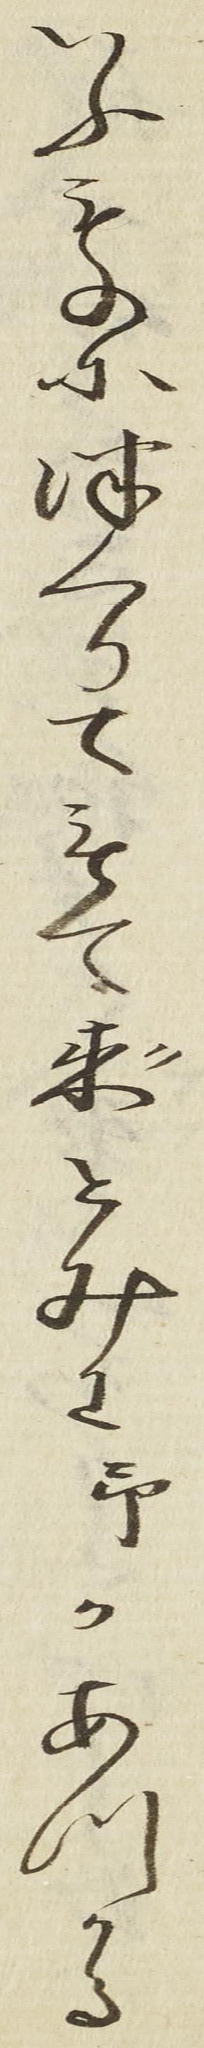いふものにつくりてもて来とみに予かあつかる
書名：やぶれ窓の記　全
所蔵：東京大学地震研究所図書室 Earthquake Research Institute Library, The University of Tokyo, JAPAN
